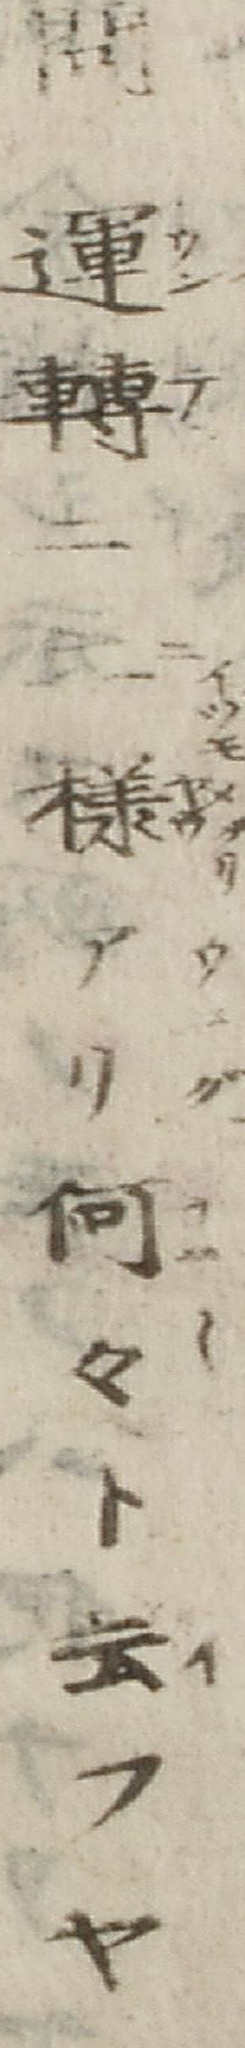問運転ニ二様アリ何々ト云フヤ
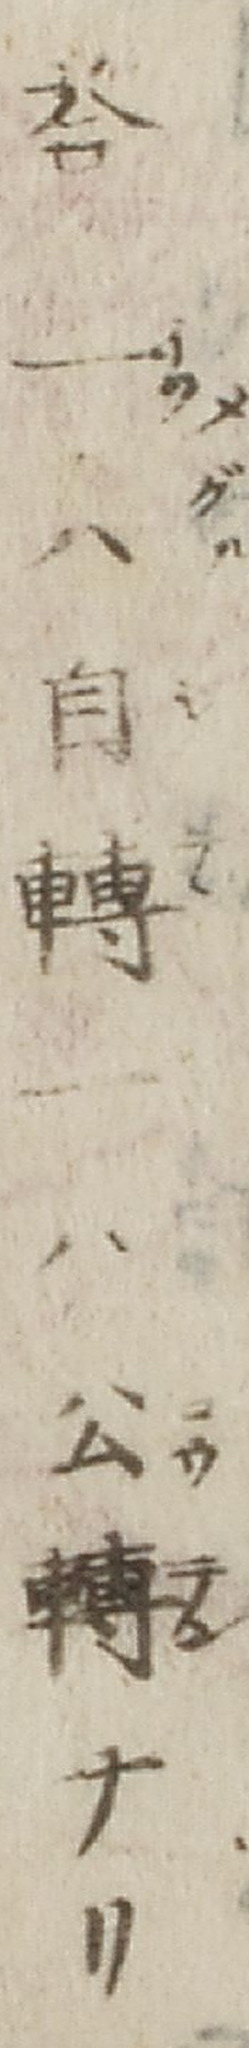答一ハ自転一ハ公転ナリ
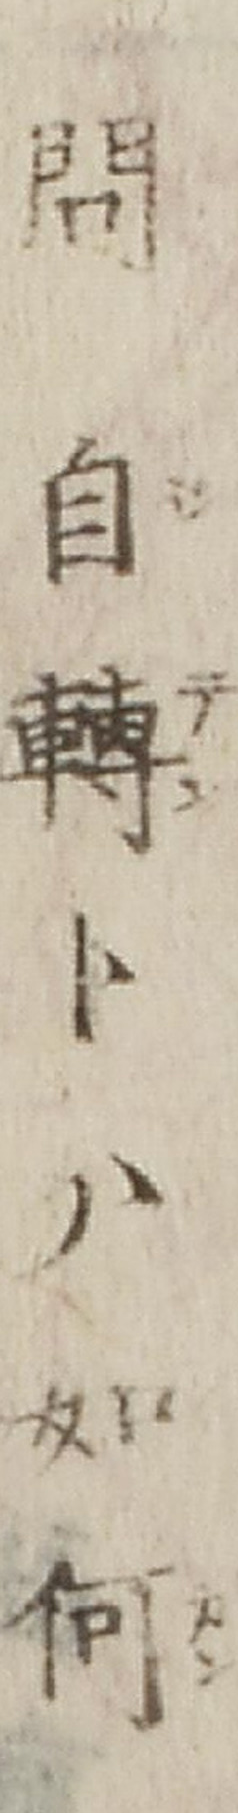問自転トハ如何
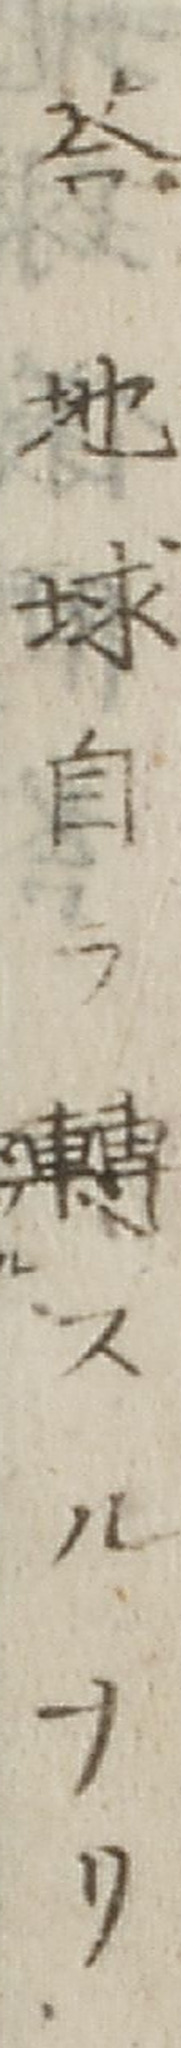答地球自ラ転スルナリ
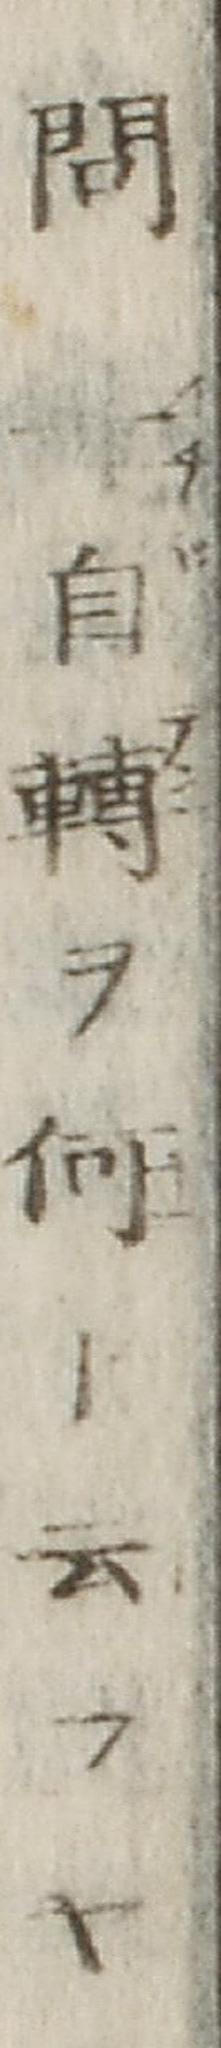問一自転ヲ何ト云フヤ
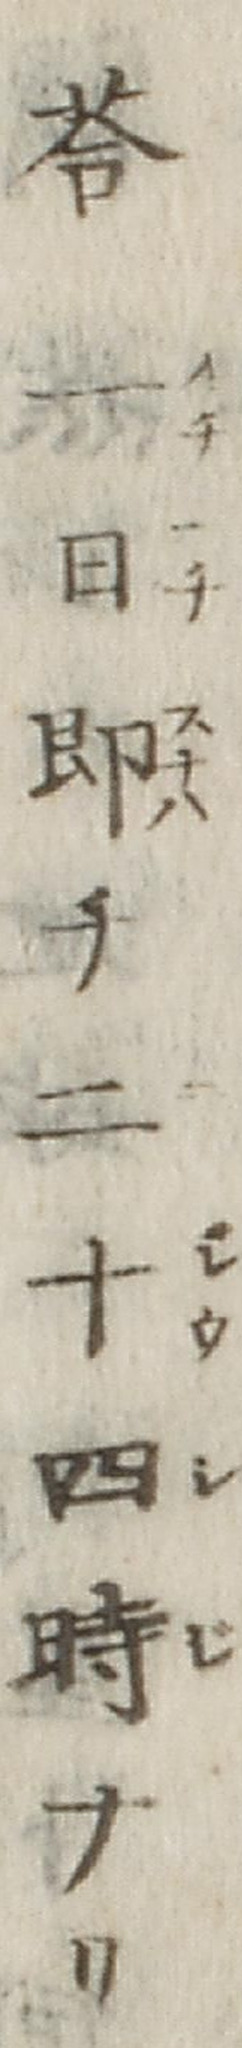答一日即チ二十四時ナリ
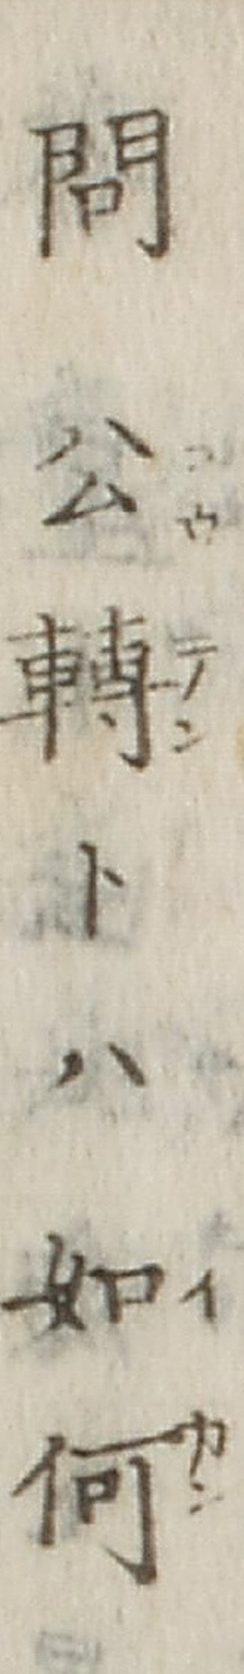問公転トハ如何
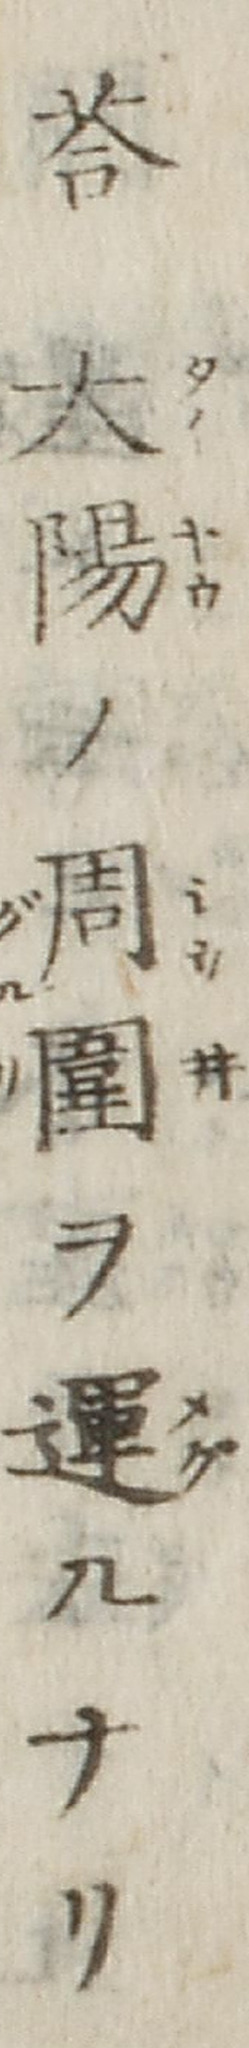答大陽ノ周圍ヲ運ルナリ
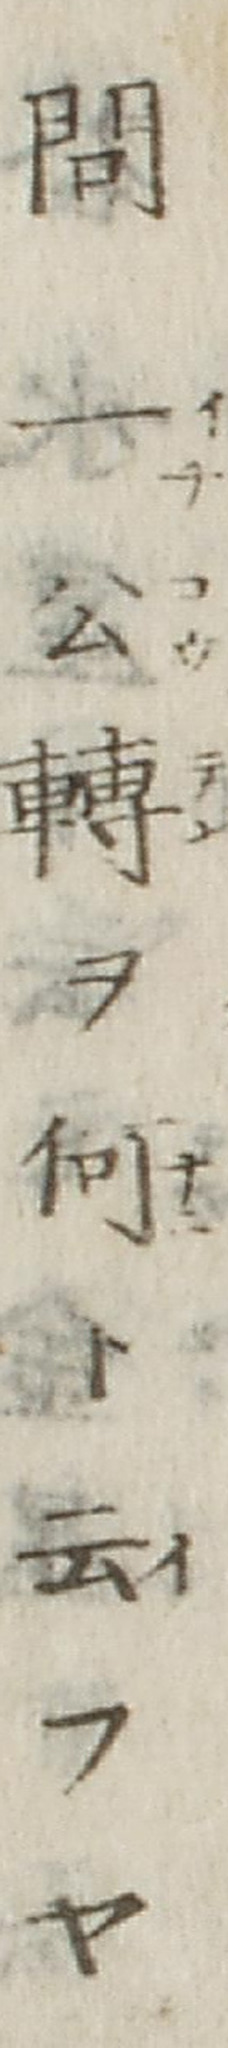問一自転ヲ何ト云フヤ
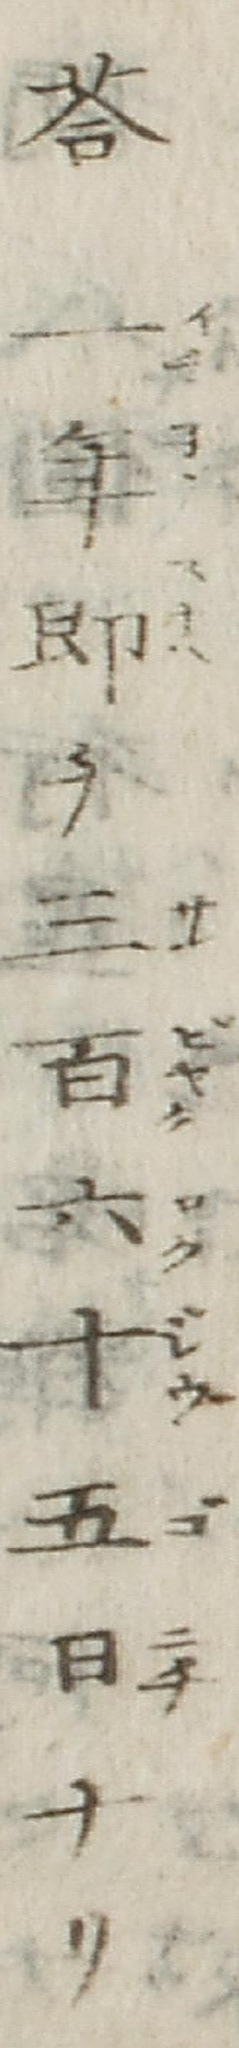答一年即チ三百六十五日ナリ
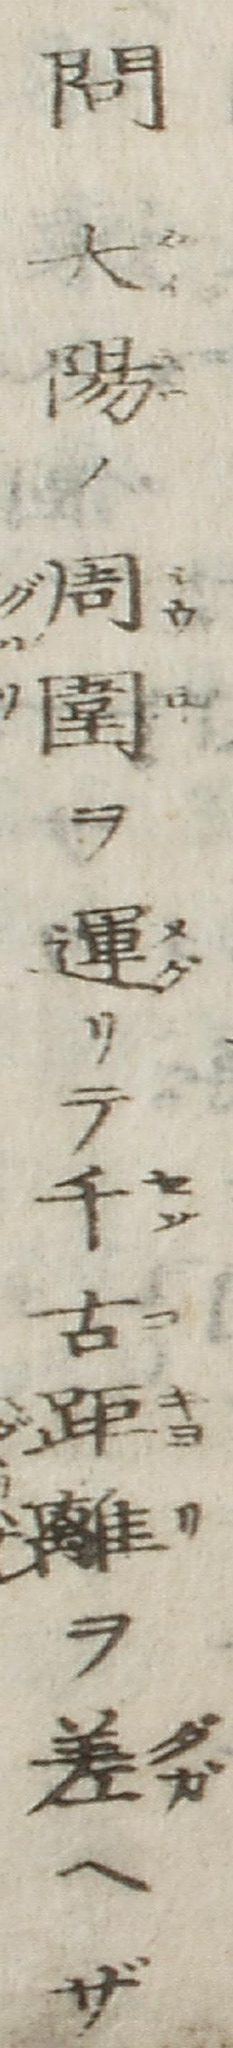問大陽ノ周圍ヲ運リテ千古距離ヲ差へザ
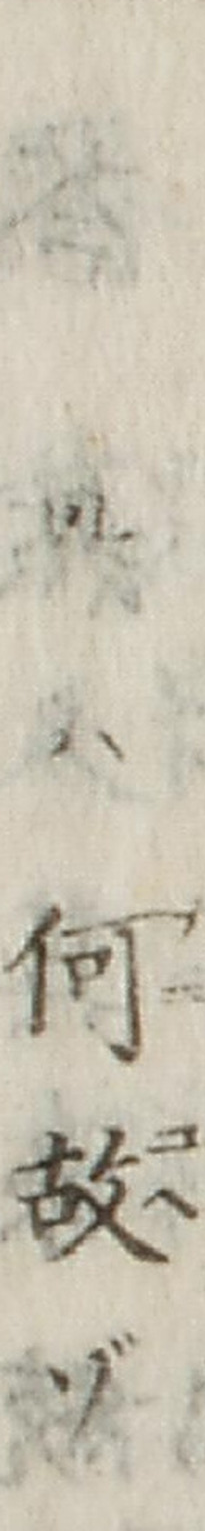ルハ何故ゾ
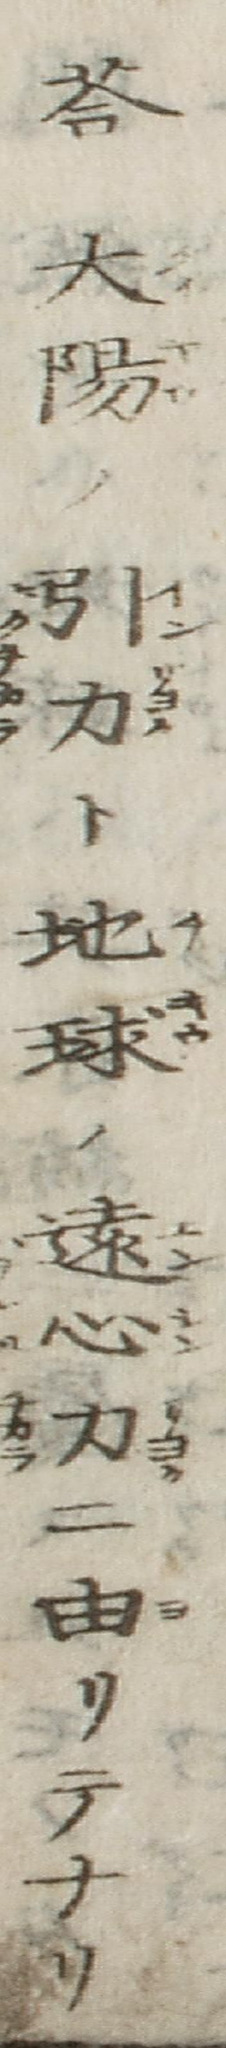答大陽ノ引力ト地球ノ遠心力ニ由リテナリ
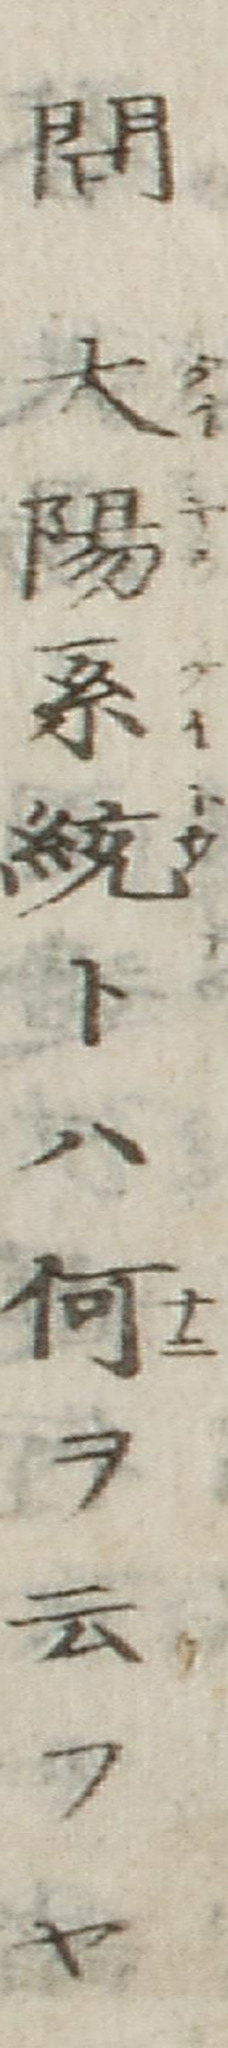問大陽系統トハ何ヲ云フヤ

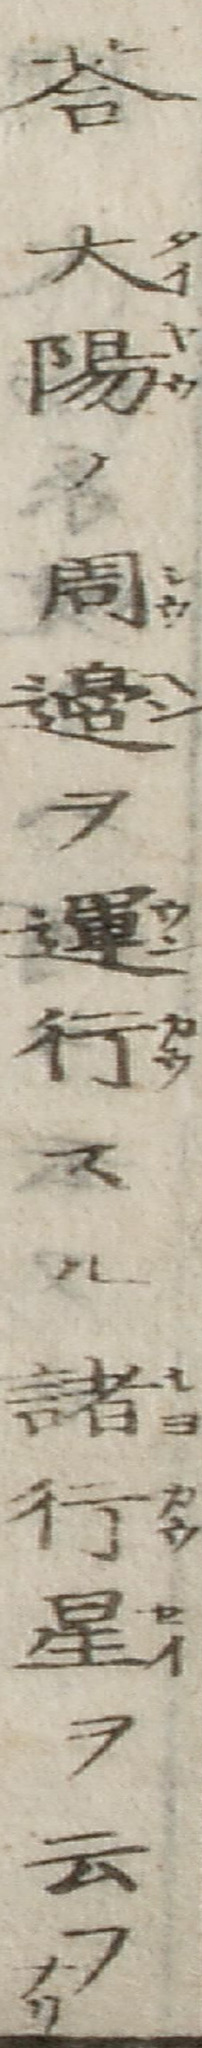答大陽ノ周辺ヲ運行スル諸行星ヲ云フナリ
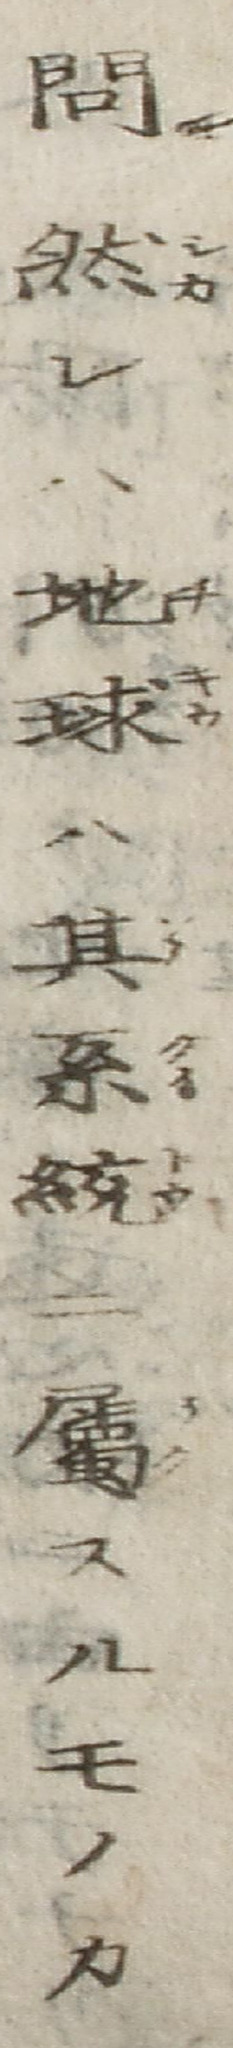問然レハ地球ハ其系統ニ属スルモノカ
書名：地球儀問答　全
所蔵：東京大学地震研究所図書室 Earthquake Research Institute Library, The University of Tokyo, JAPAN
